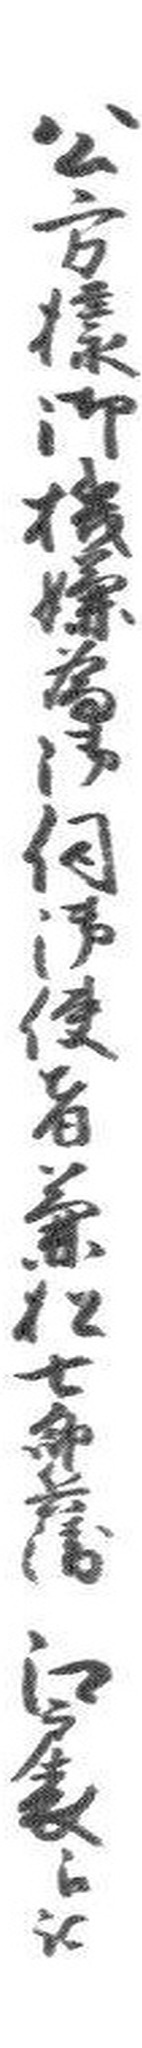公方様御機嫌為御伺御使者兼松七郎兵衛江戸表江被
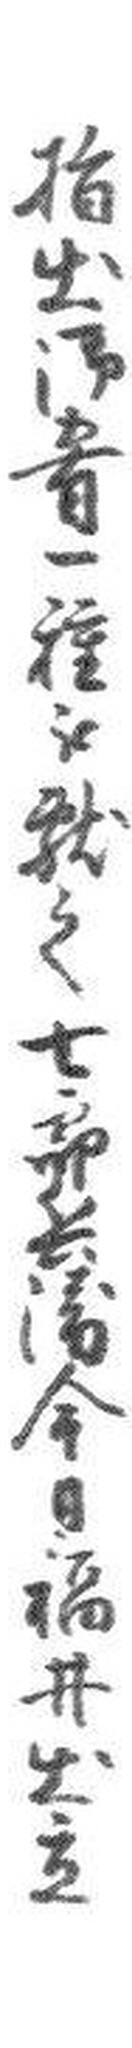指出御肴一種被献之七郎兵衛今日福井出立
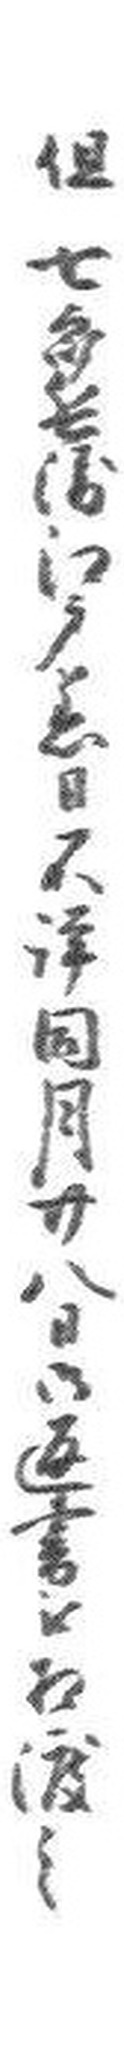但七郎兵衛江戸着日不詳同月廿八日御返書被相渡之
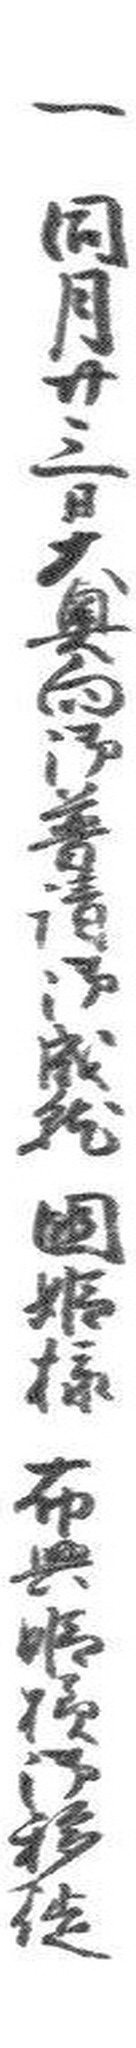一同月廿三日大奥向御普請御成就国姫様布与姫様御移徙
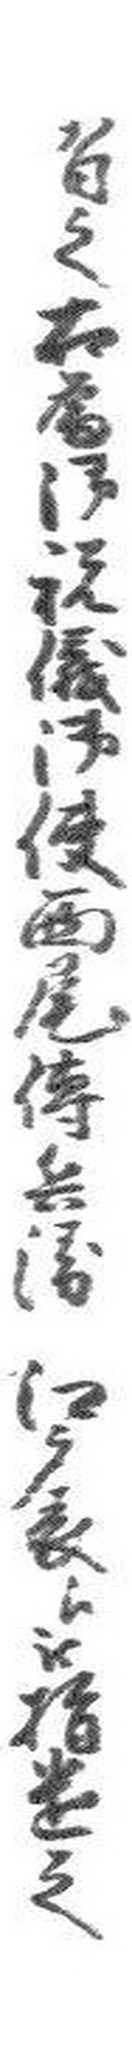有之右為御祝儀御使西尾伝兵衛江戸表江被指遣之
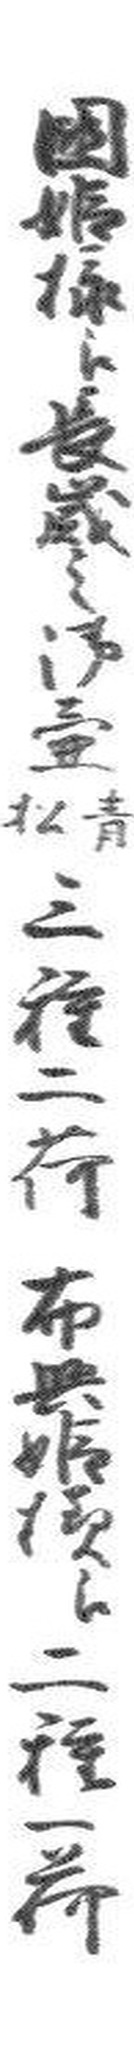国姫様江長歳之御壺青松三種二荷布与姫様江二種一荷

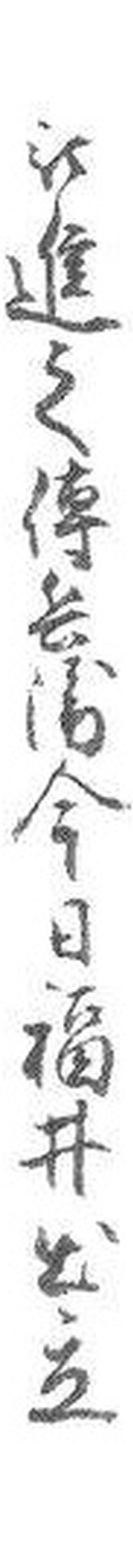被進之伝兵衛今日福井出立
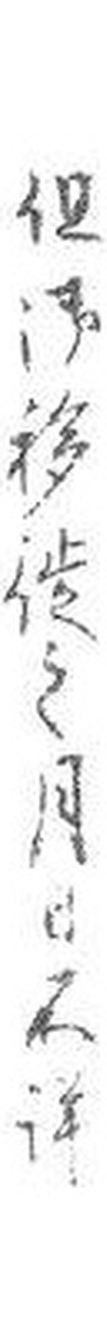但御移徙之月日不詳
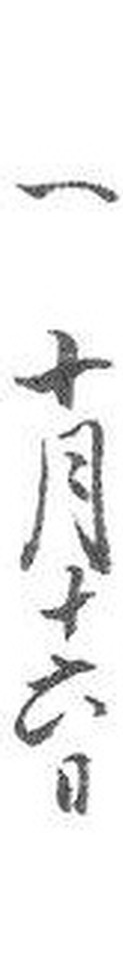一十月十六日
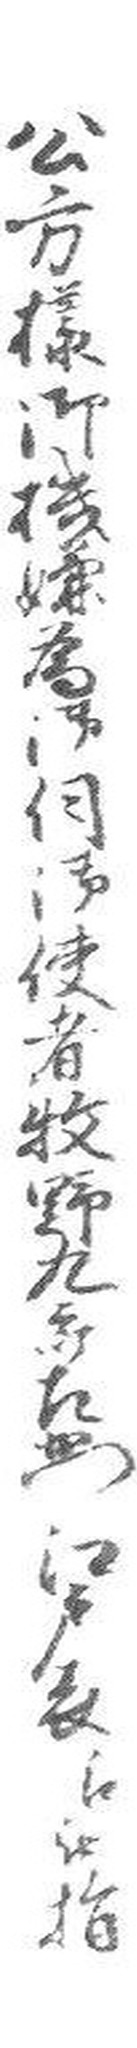公方様御機嫌為御伺御使者牧野九郎左衛門江戸表江被指
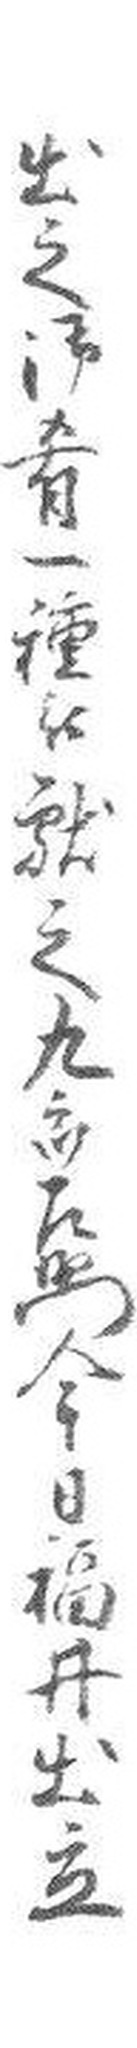出之御肴一種被献之九郎左衛門今日福井出立
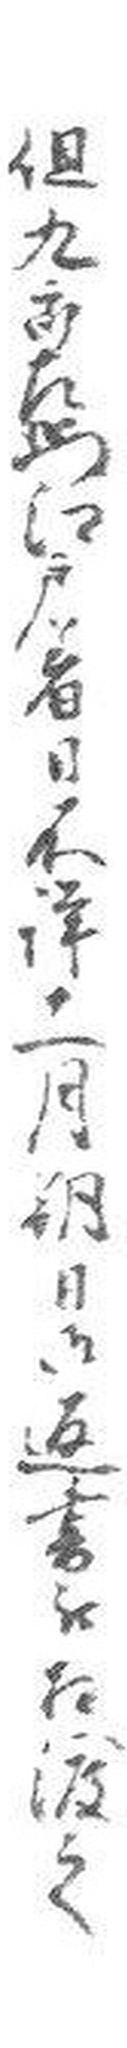但九郎左衛門江戸着日不詳十一月朔日御返書被相渡之
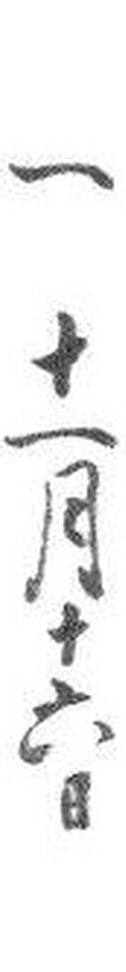一十一月十六日
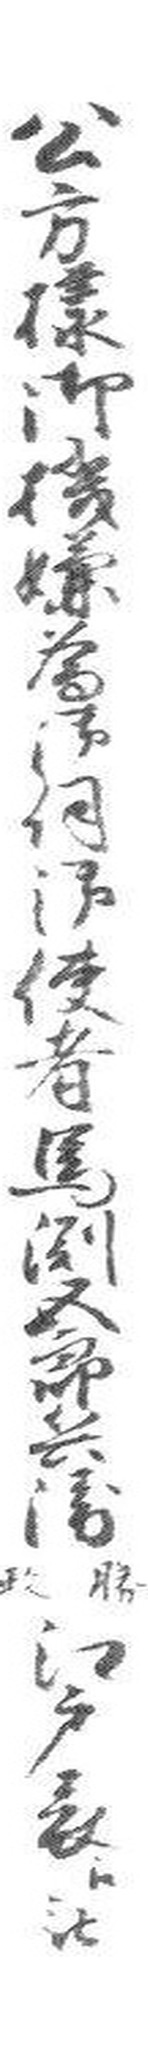公方様御機嫌為御伺御使者馬渕五郎兵衛勝政江戸表江被
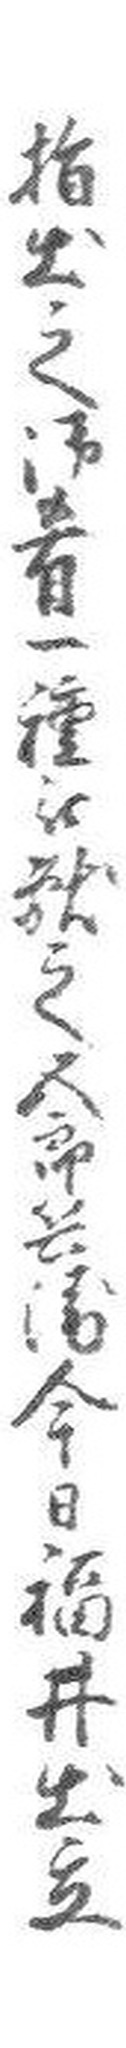指出之御肴一種被献之五郎兵衛今日福井出立
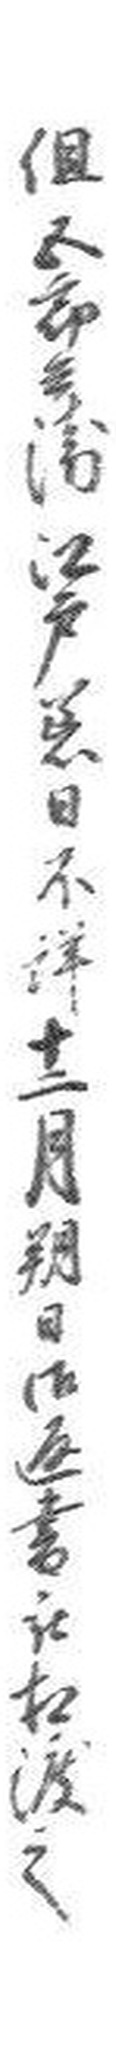但五郎兵衛江戸着日不詳十二月朔日御返書被相渡之
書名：家譜 七 光通公 従寛文四年到同九年
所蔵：福井県文書館 Fukui Prefectural Archives
